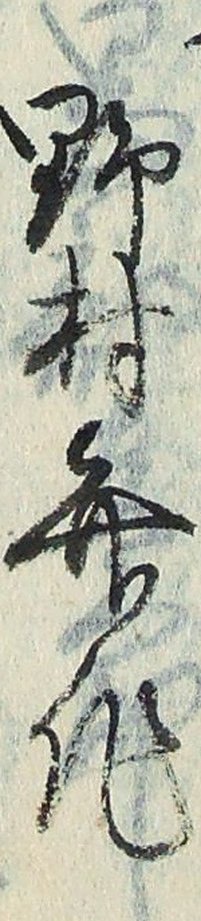野村弁作
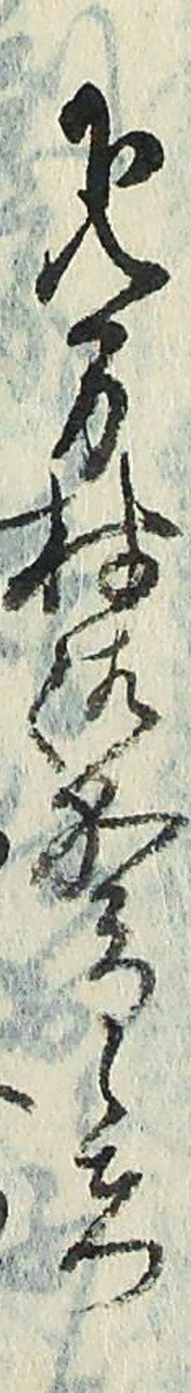下八万村御駕之者
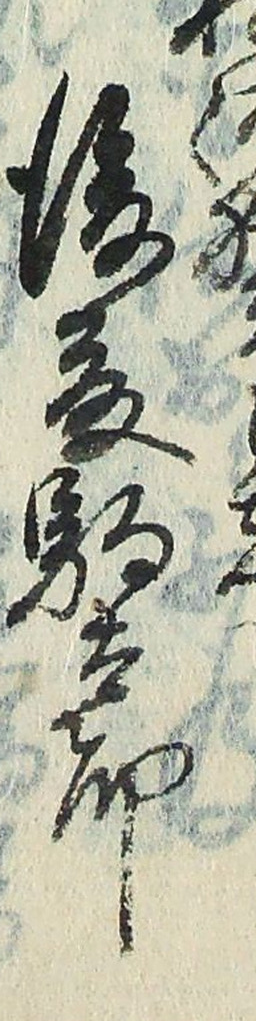後藤駒太郎
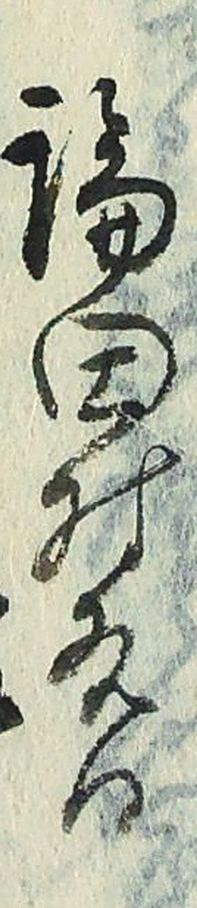輪田村右同
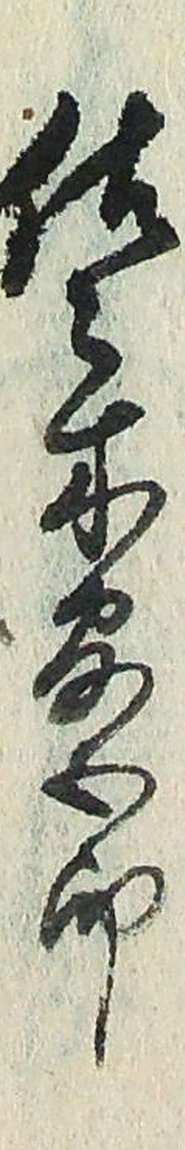佐々木官五郎
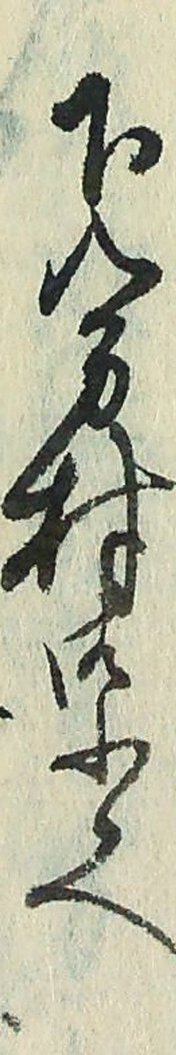下八万村御小人
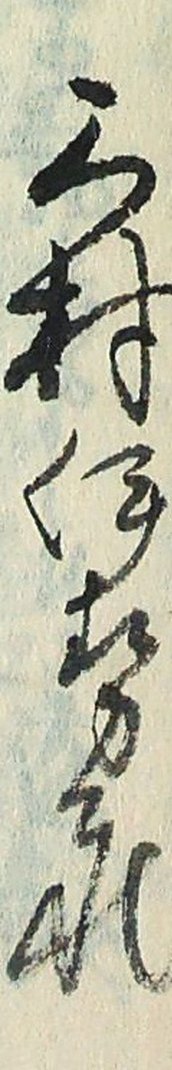三村伊勢蔵
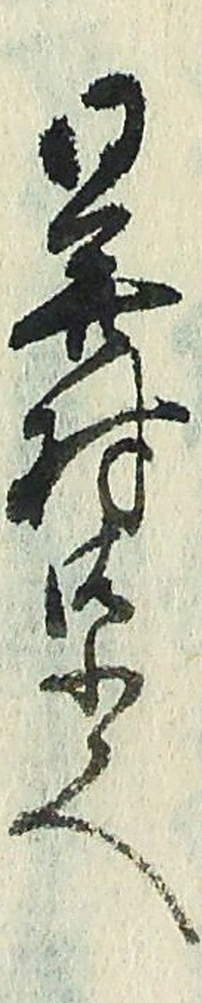日開村御小人
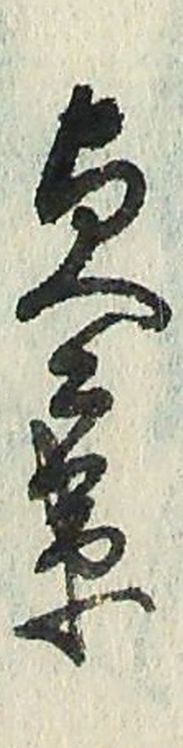貞兵衛
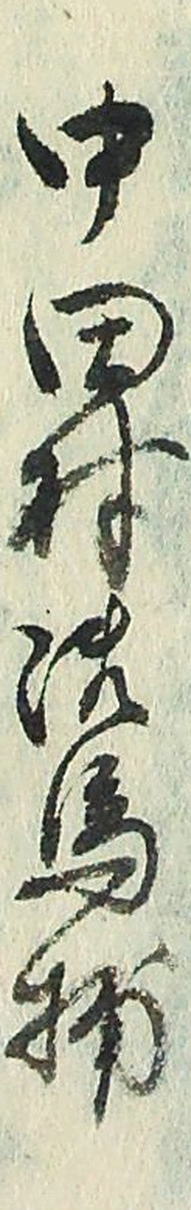中田村御馬捕
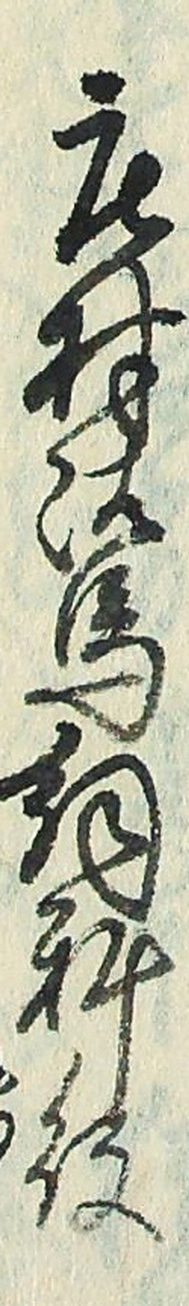庄村御馬飼料役
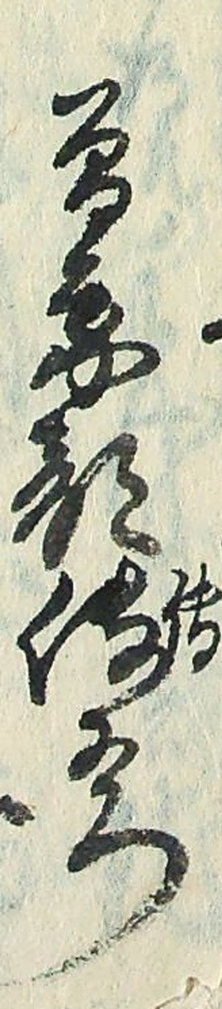曽我部傳右衛門
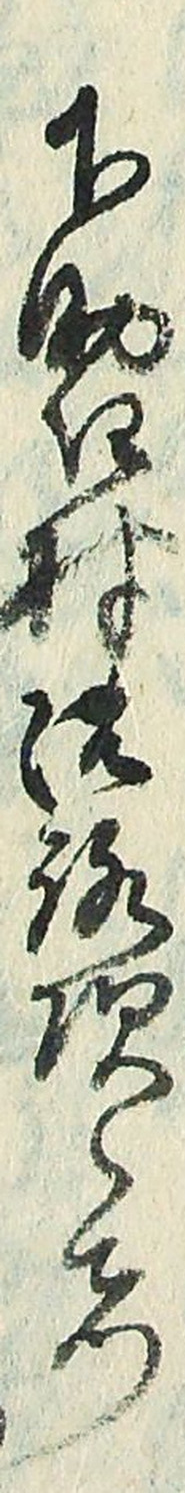下助任村御路次之者
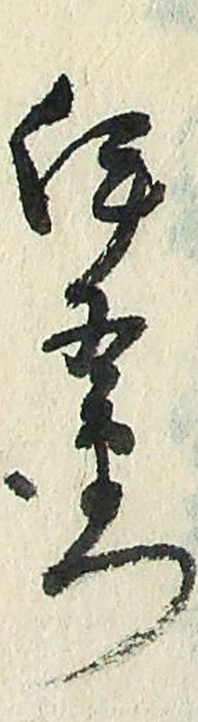伊五右衛門

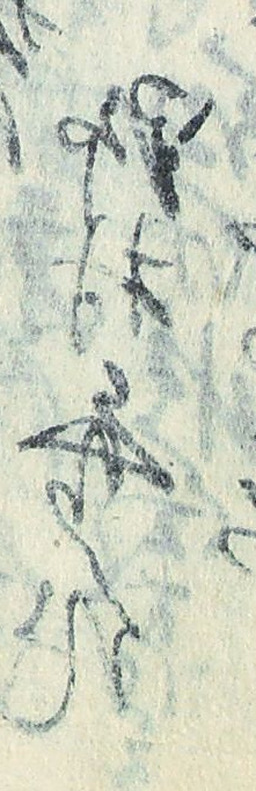巳八月十一日
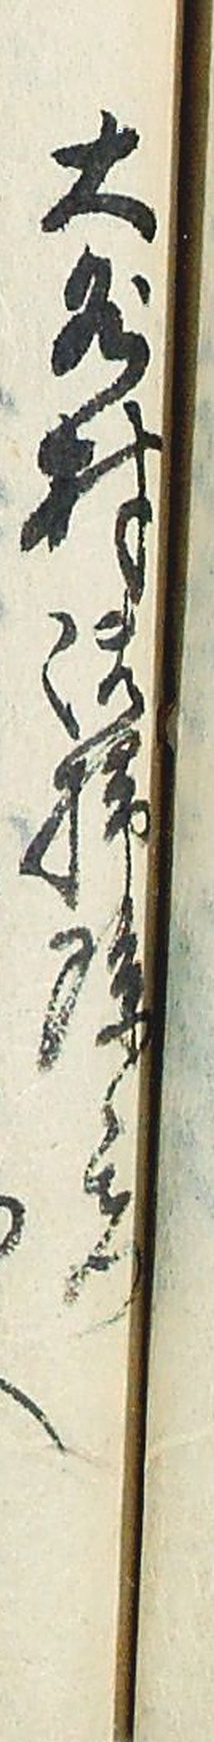大谷村御掃除之者
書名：諸御趣意書并御下知向之写
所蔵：鳴門教育大学 Naruto University of Education
